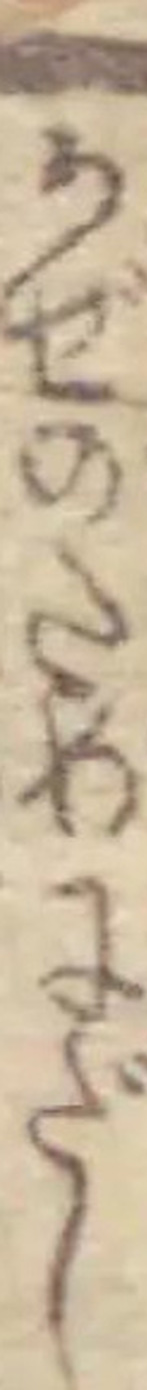かぜのためにだし
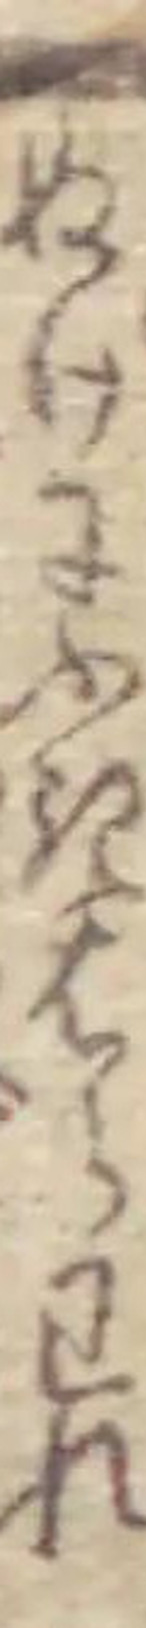ぬけにふきはらわれ
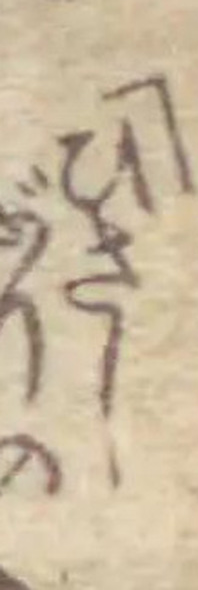〽ひさし
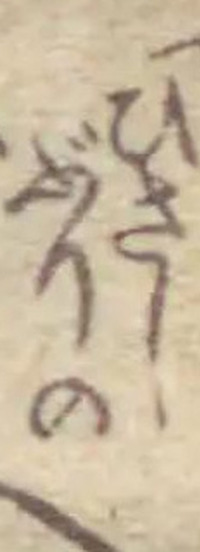ぶりの
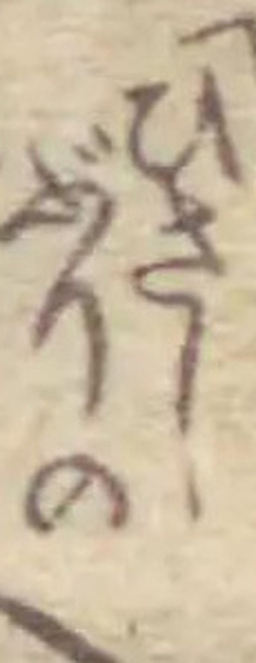ぶりの
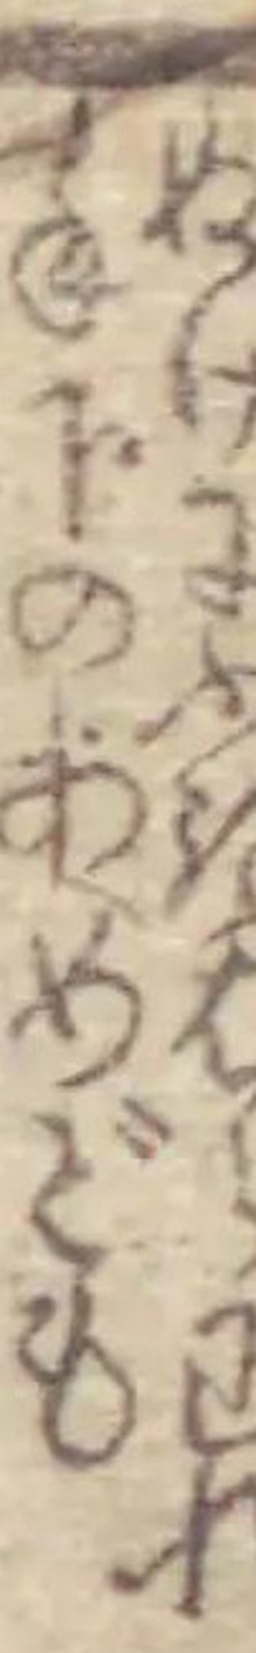手下のあめども
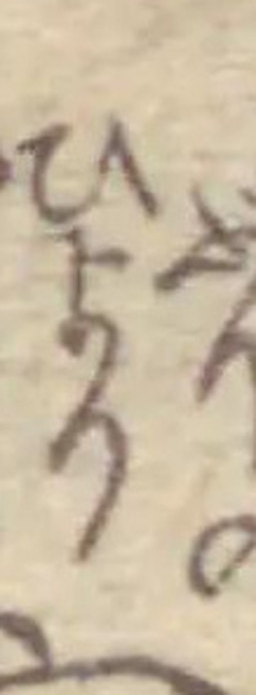ひより
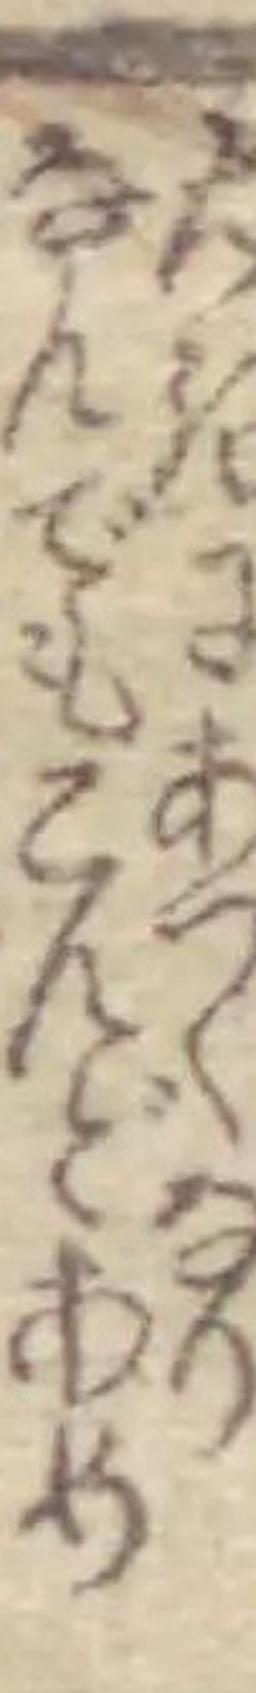なんでもこんどあめ
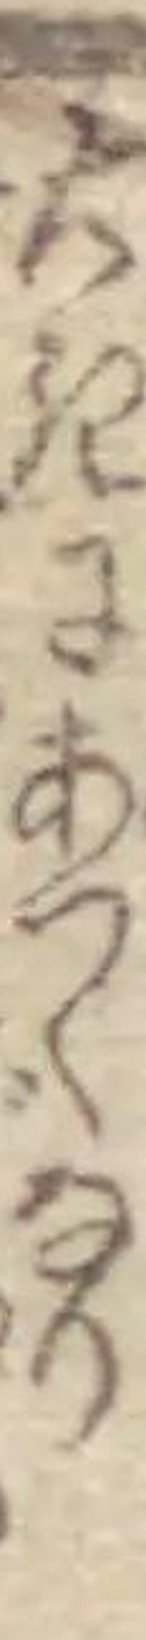大きにあつくなり
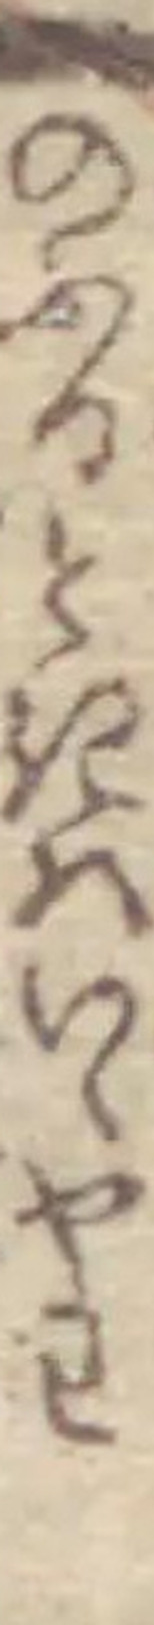のふるときはいゝやわ
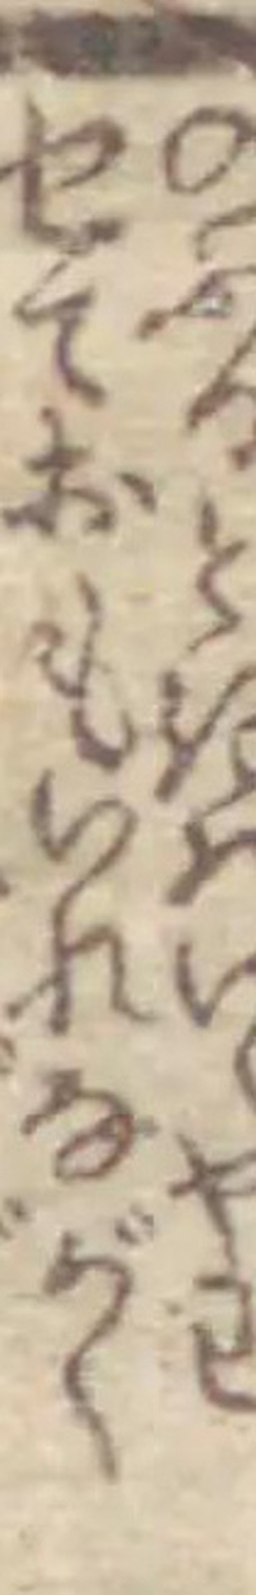せておもいれながく
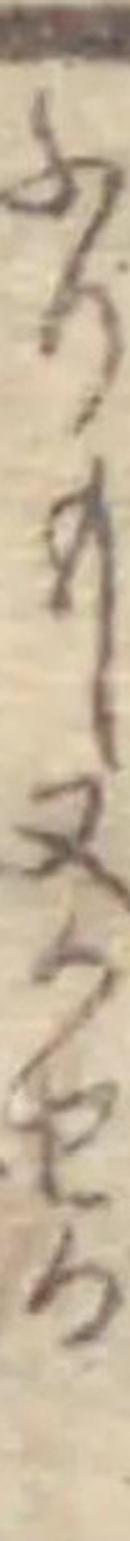ふりもし又かぜが
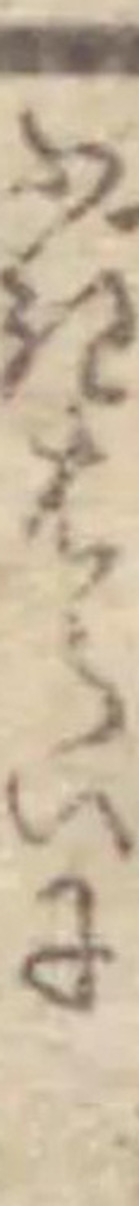ふきはらいに
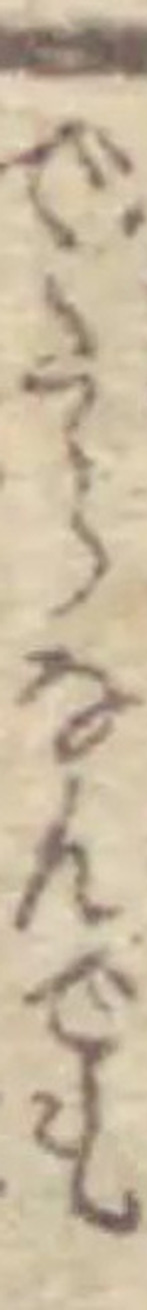でたらなんでも
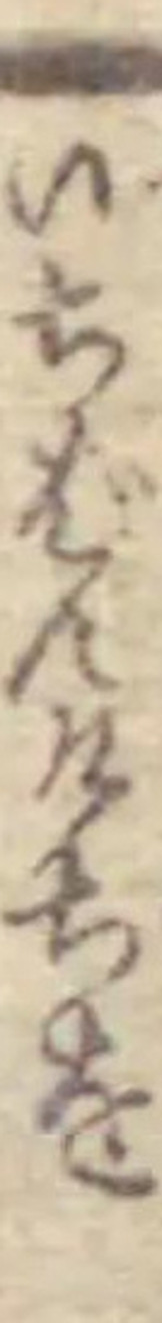いちばんけちを
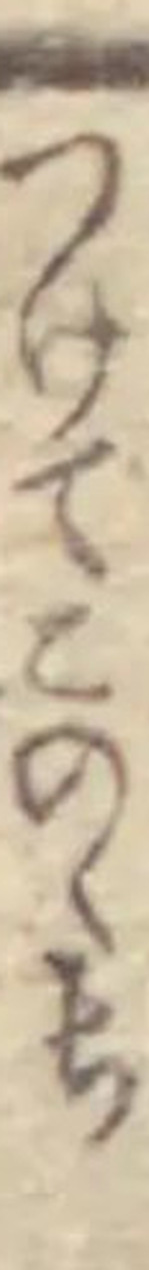つけてこのゝち
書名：雨宮風宮出儘略縁記 3巻
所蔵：国立国会図書館 National Diet Library, JAPAN
